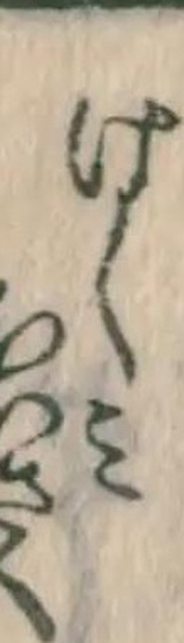けしみ
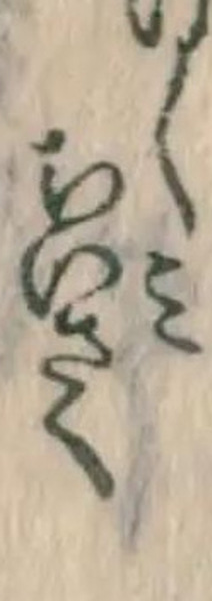ちいさく
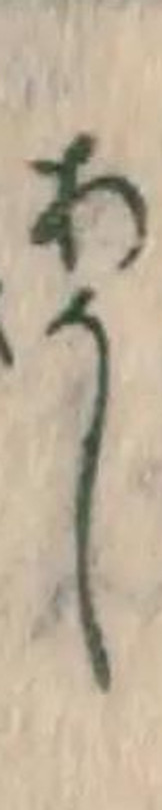ありし
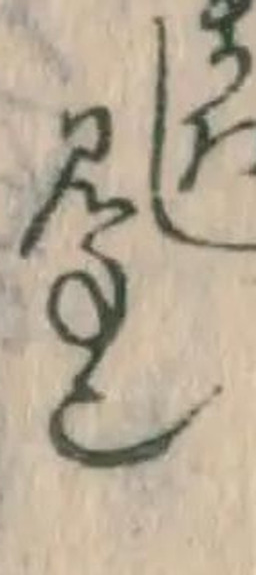見事也
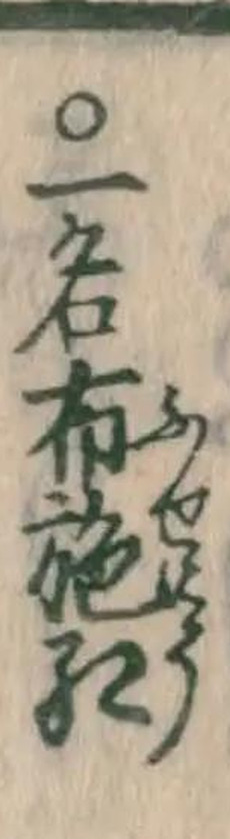○一名布施紅
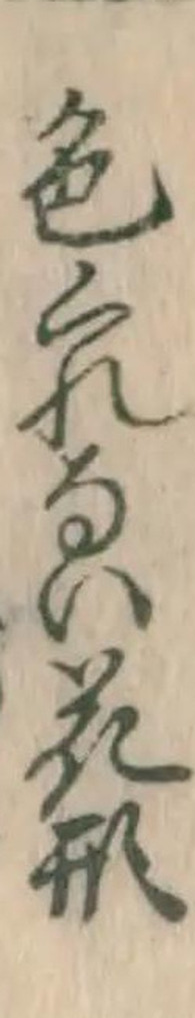色くれない花形
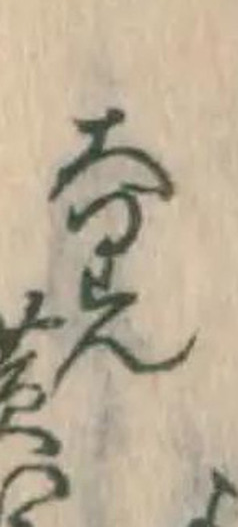大りん
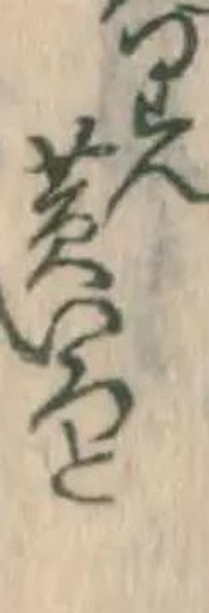黄いろと
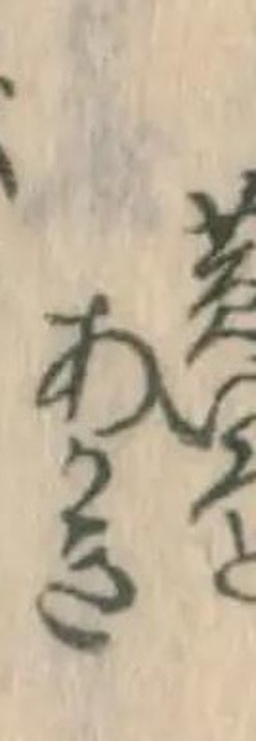あかき
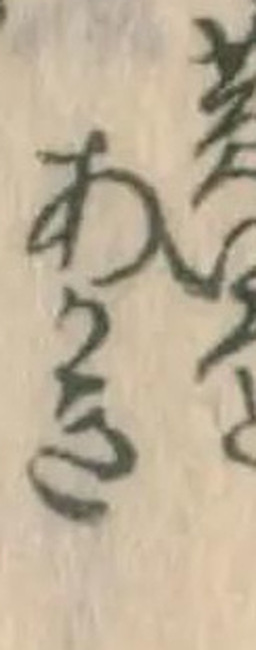あかき
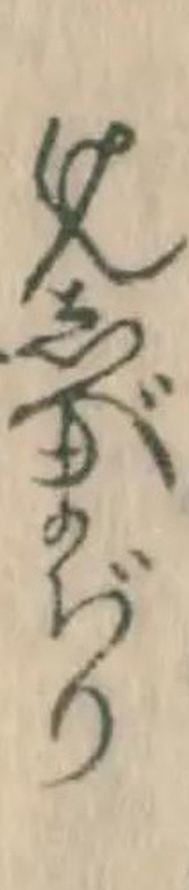けんしべまぢり
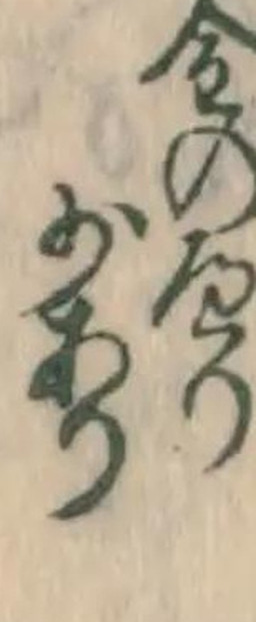少あり
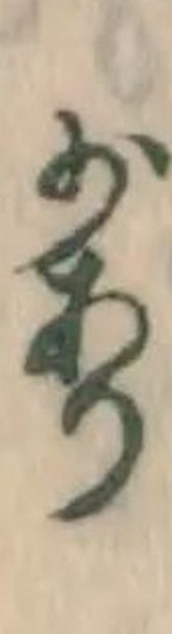少あり
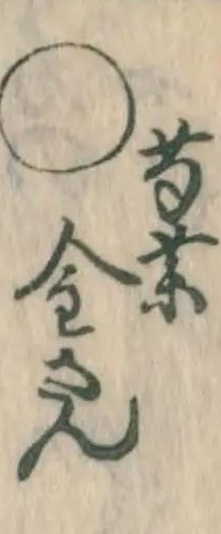金さん
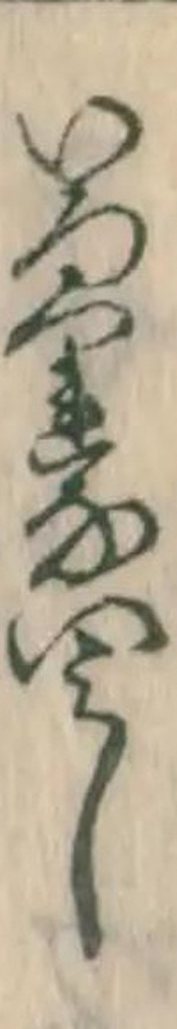いろくれないに？し
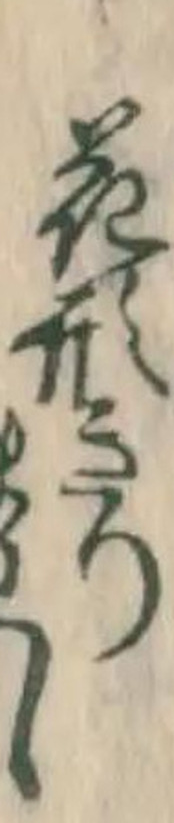花形きり
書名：艸花繪前集. [1]
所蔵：国立国会図書館 National Diet Library, JAPAN
